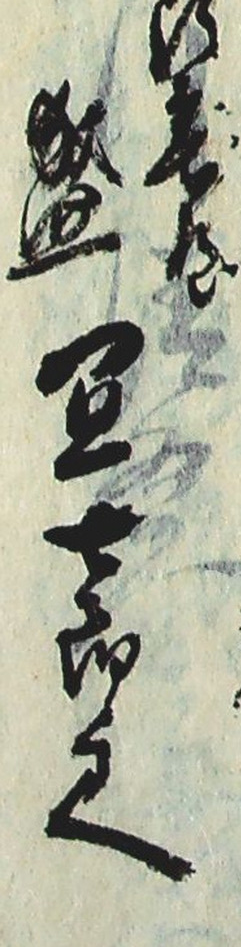盛宣七郎方へ

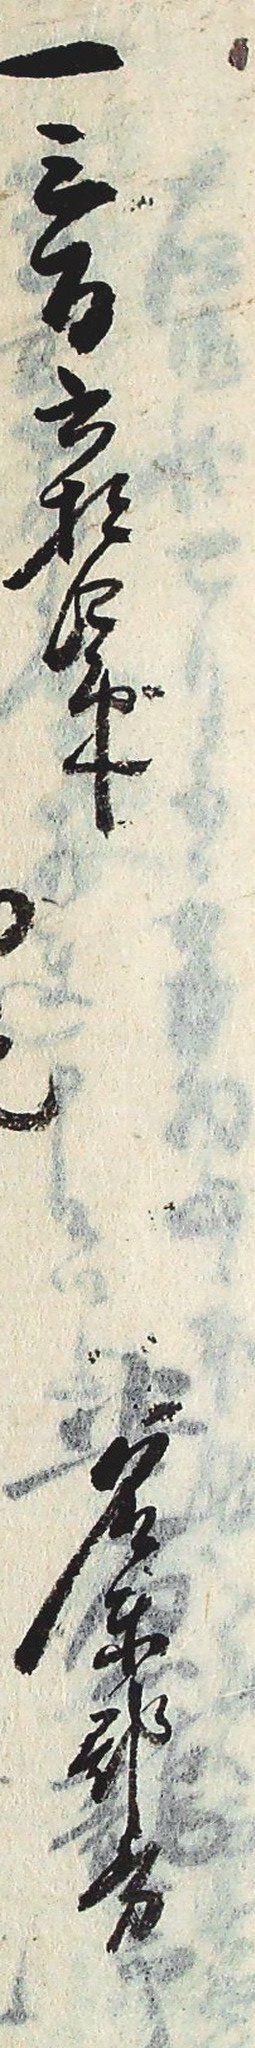一三百六拾四束名東郡分
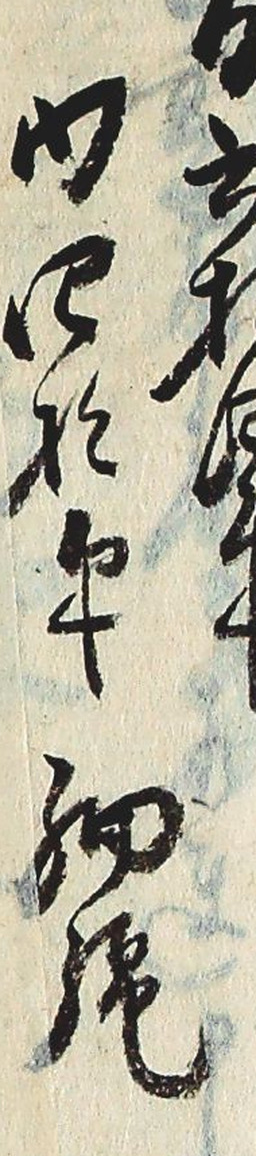内四拾束細縄
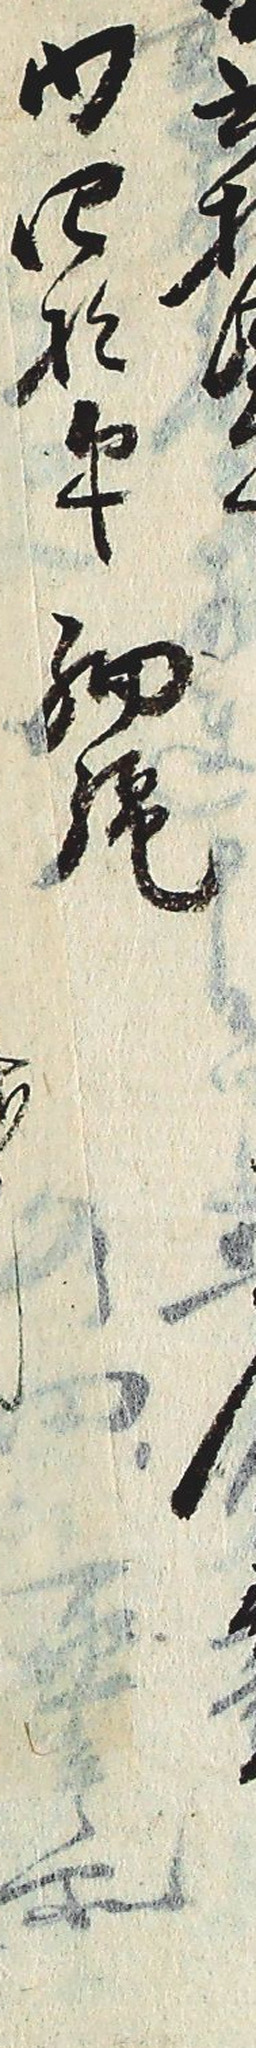内四拾束細縄
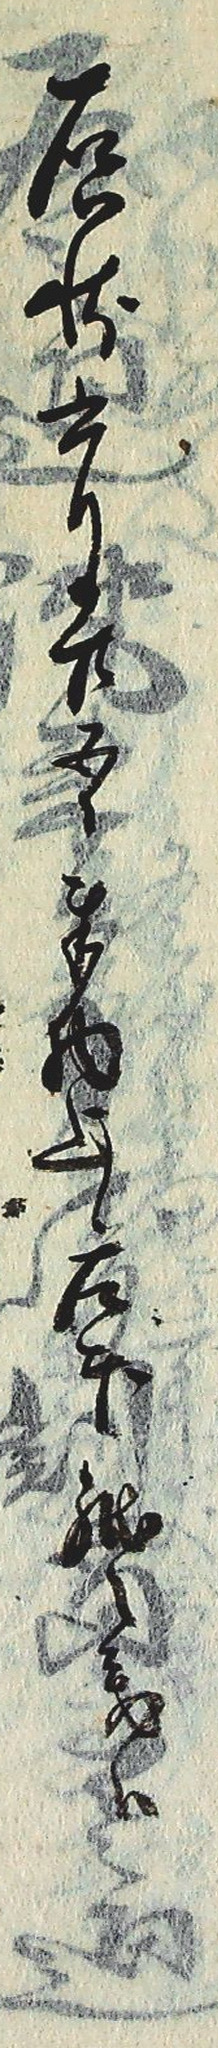右御状六月廿五日奉拝上候右本紙之義は
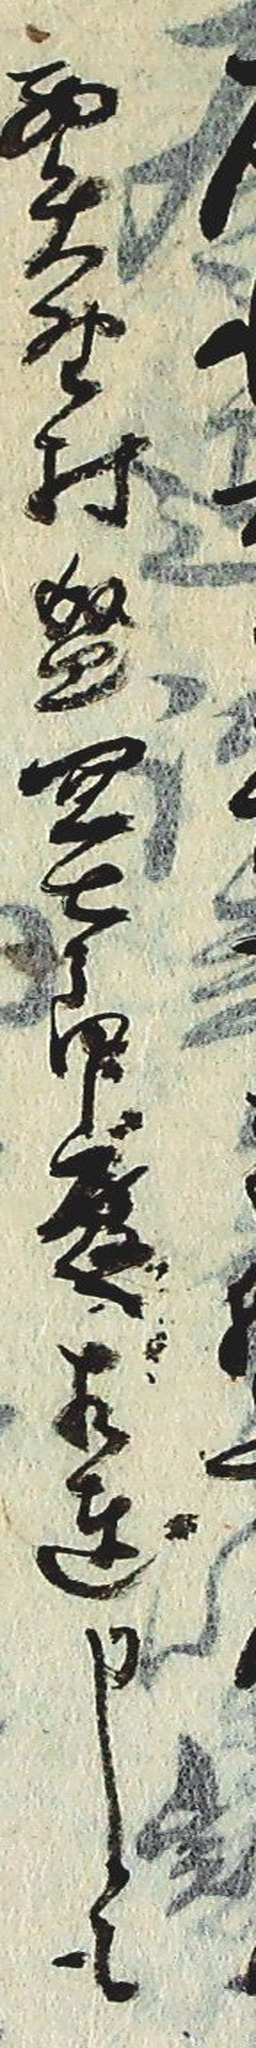西矢野村盛宣七郎殿へ相達申候以上
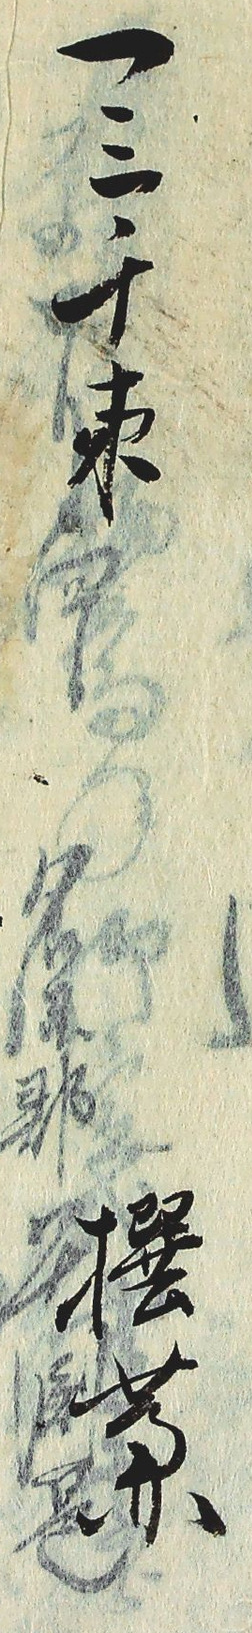一三千束撰藁
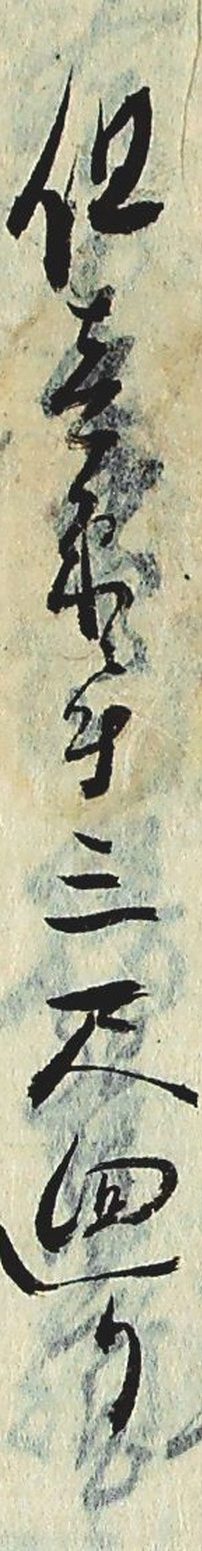但壱束に付三尺廻り
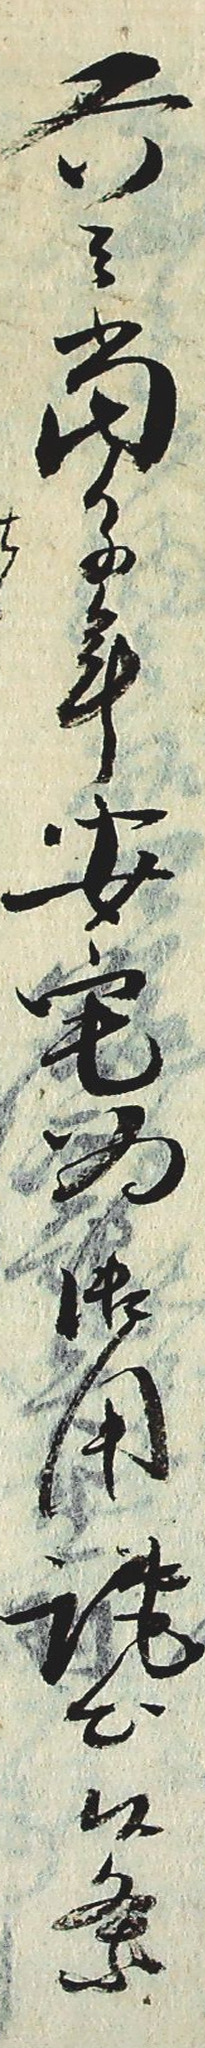右は当子年安宅為御用誂出候条
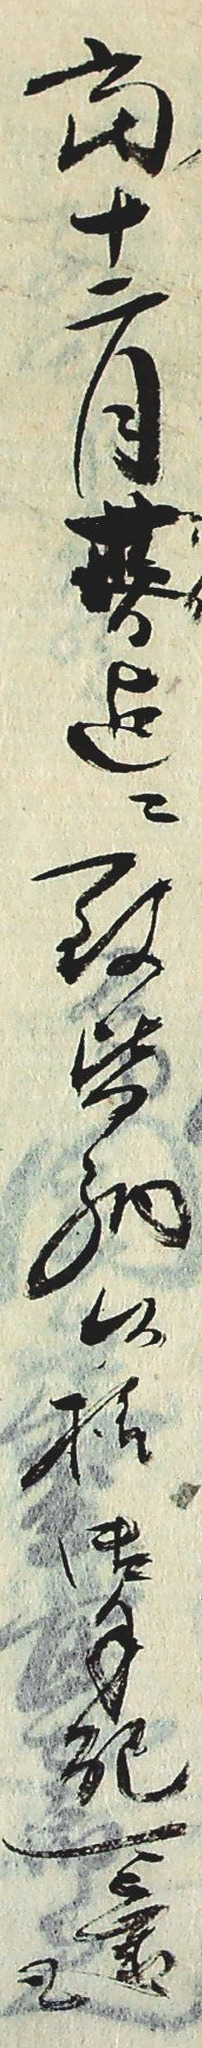当十二月廿日迄に致皆納候様御手配可被成候
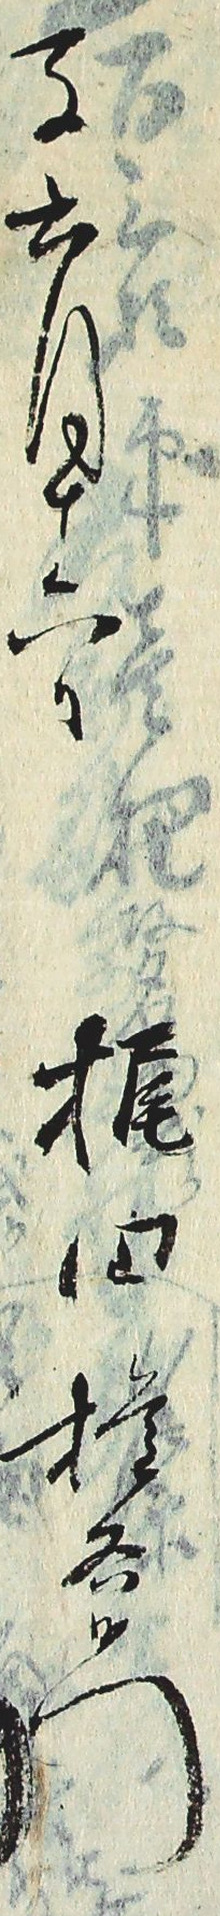六月十六日梶田権右衛門
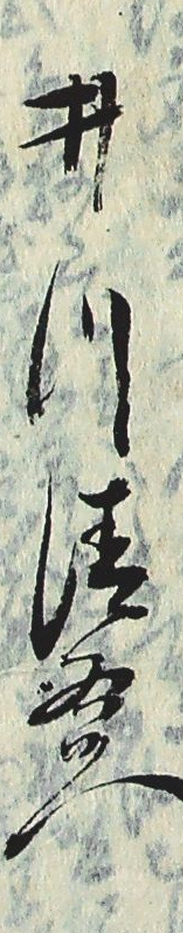井川清右衛門

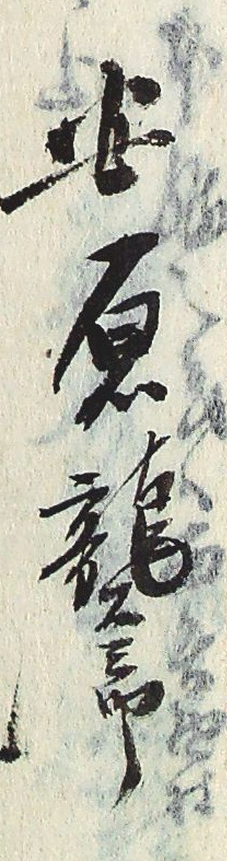安原龍太郎
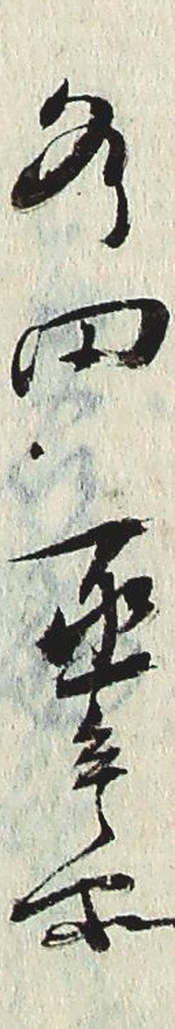水田丞兵衛
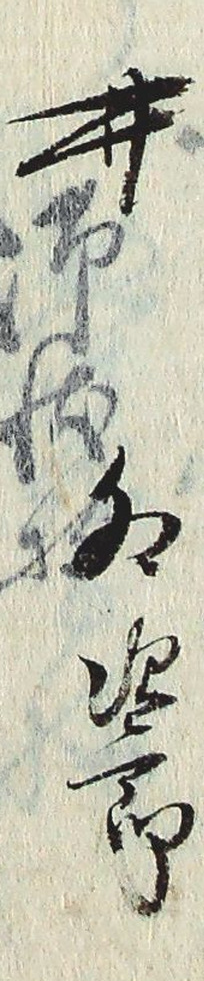井卯次郎
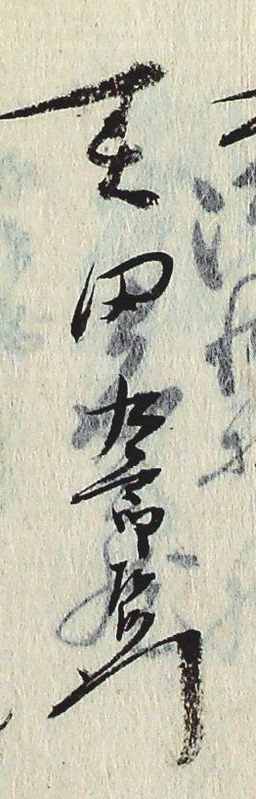春田九郎左衛門
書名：名東郡中諸割賦元帳
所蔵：鳴門教育大学 Naruto University of Education
